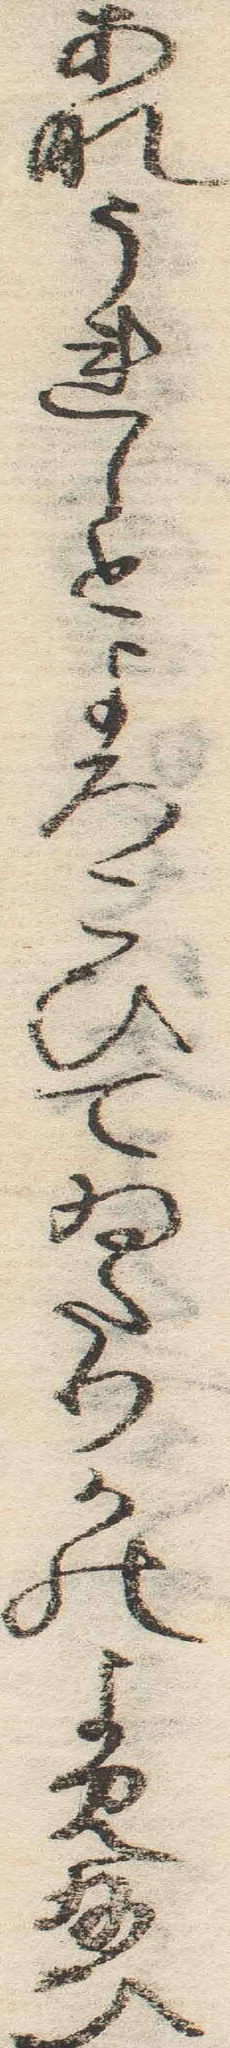あなうれしとよろこひてゐたりかのよみ給ひ
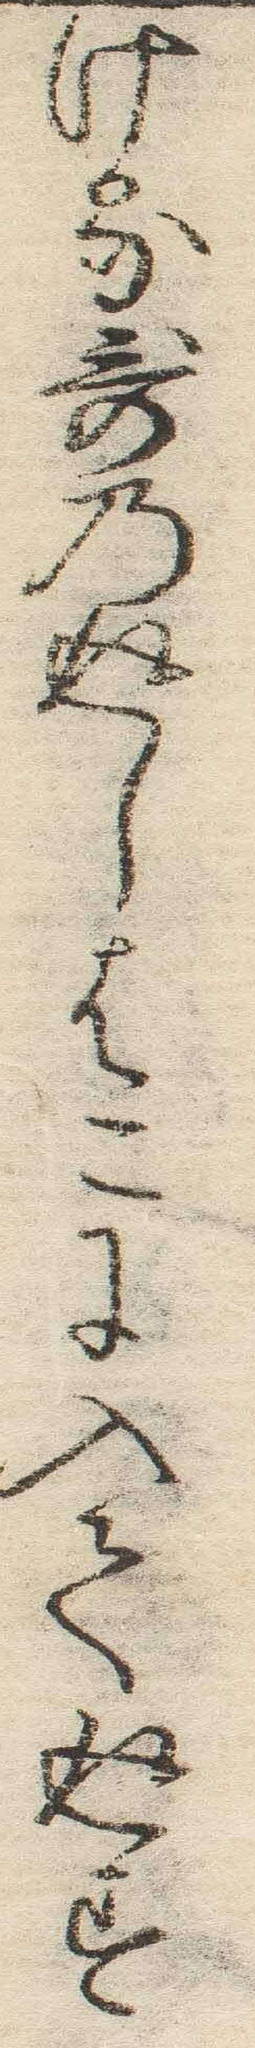ける歌の返しはこに入て返す
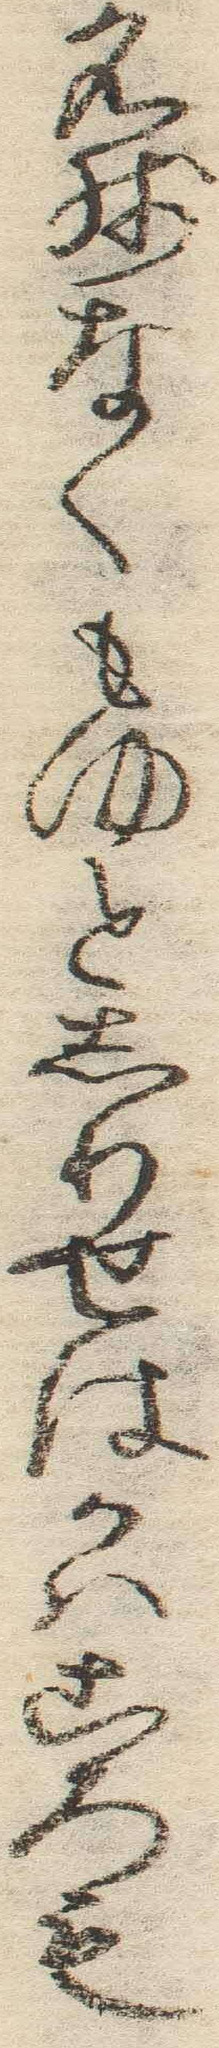名残なくもゆとしりせはかはころも
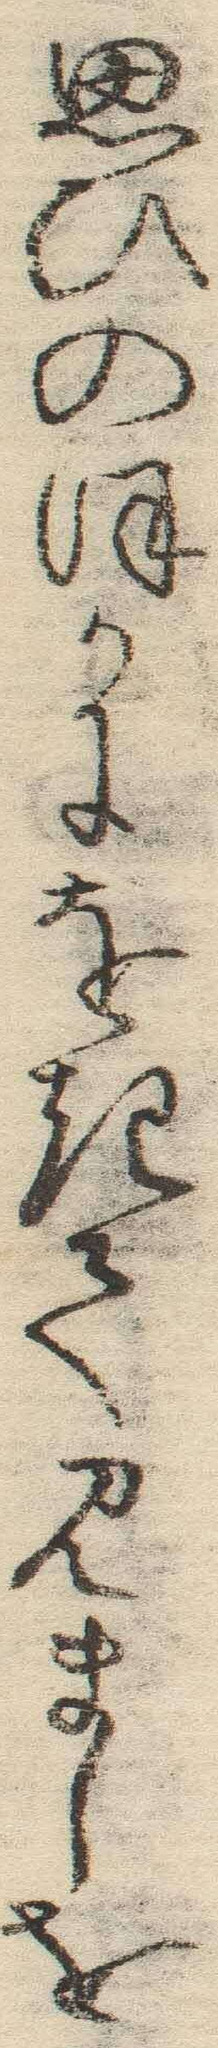思ひのほかにをきて見ましを

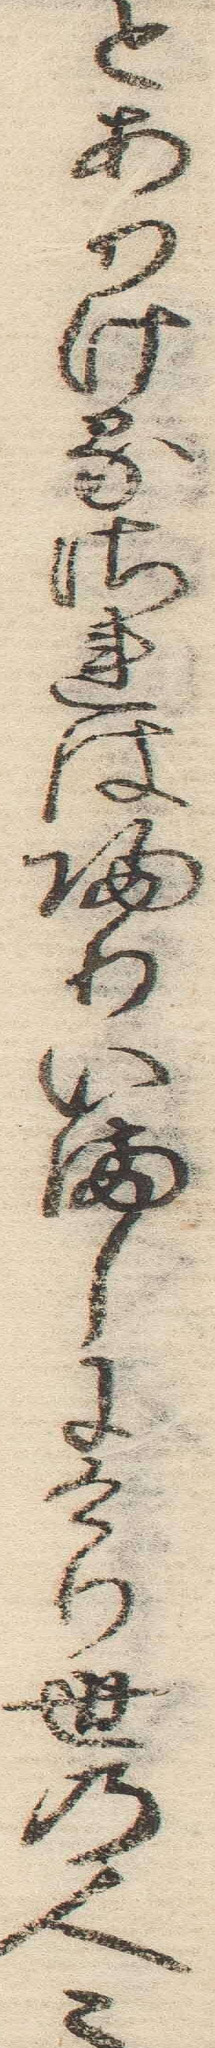とありけるされは帰りいましにけり世の人々
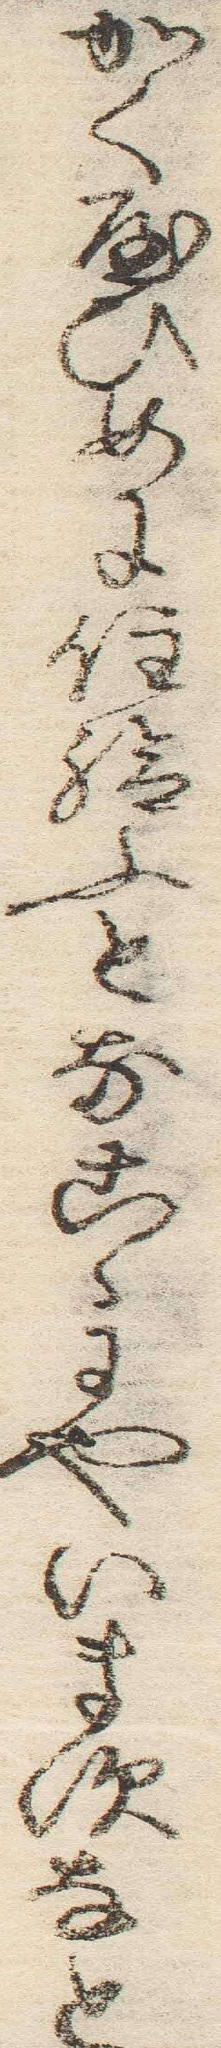かくやひめに住給ふとなこゝにやいますなと
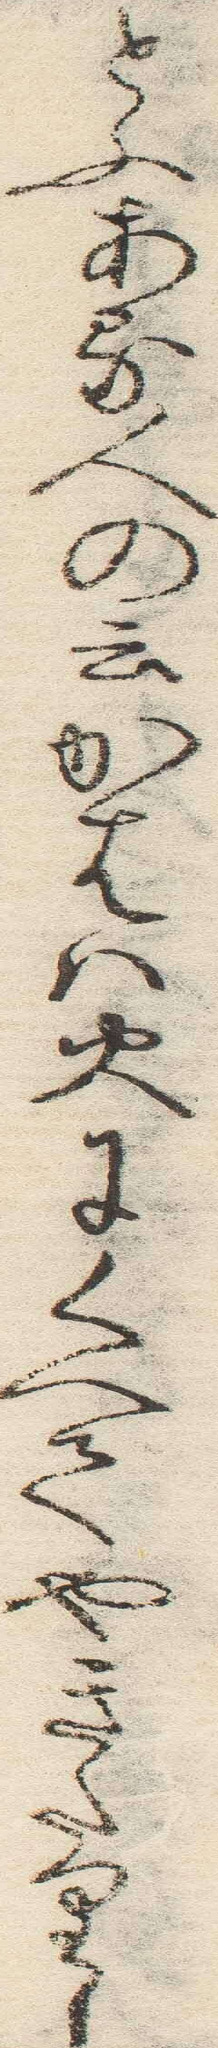とふある人の云かはは火にくへてやきたりし
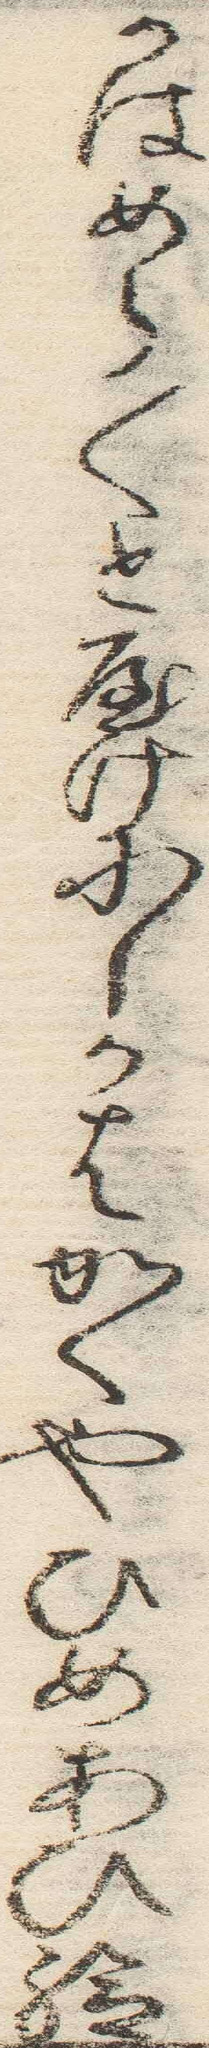かはめら〳〵とやけにしかはかくやひめあひ給
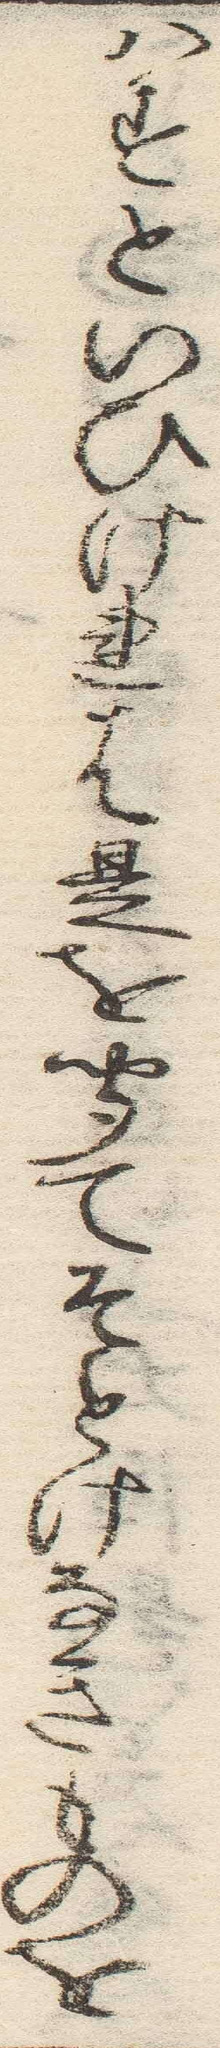はすといひけれは是を聞てそとけなきものを
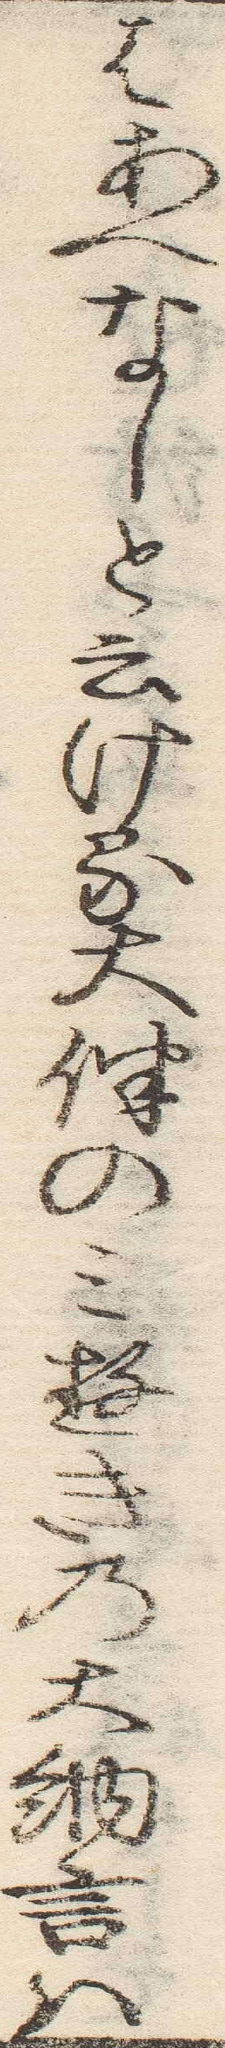はあへなしと云ける大伴のみゆきの大納言は
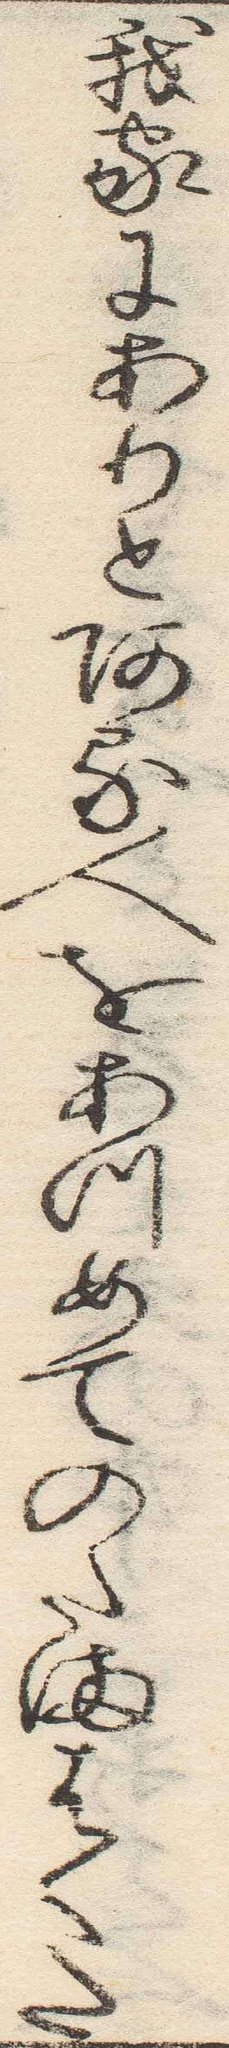我家にありとある人をあつめてのたまはくた
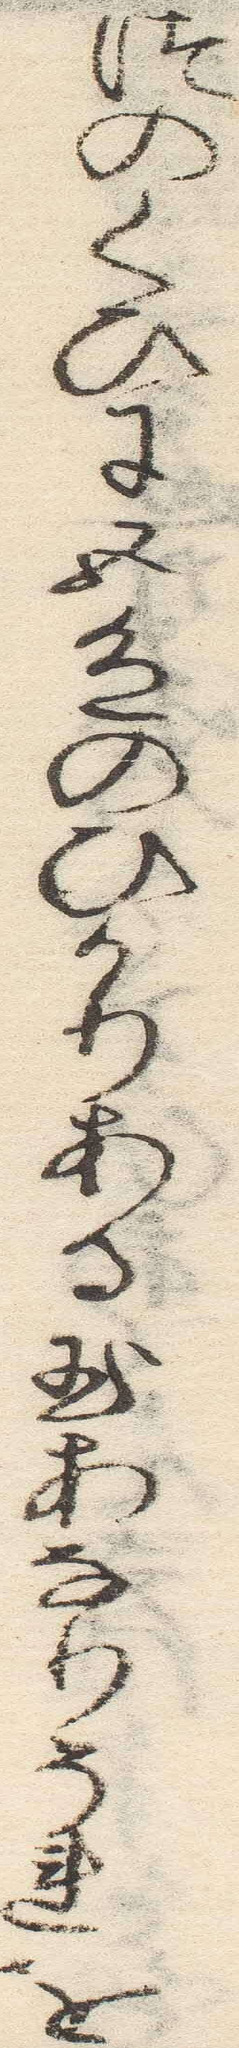つのくひに五色のひかりある玉あなりそれを
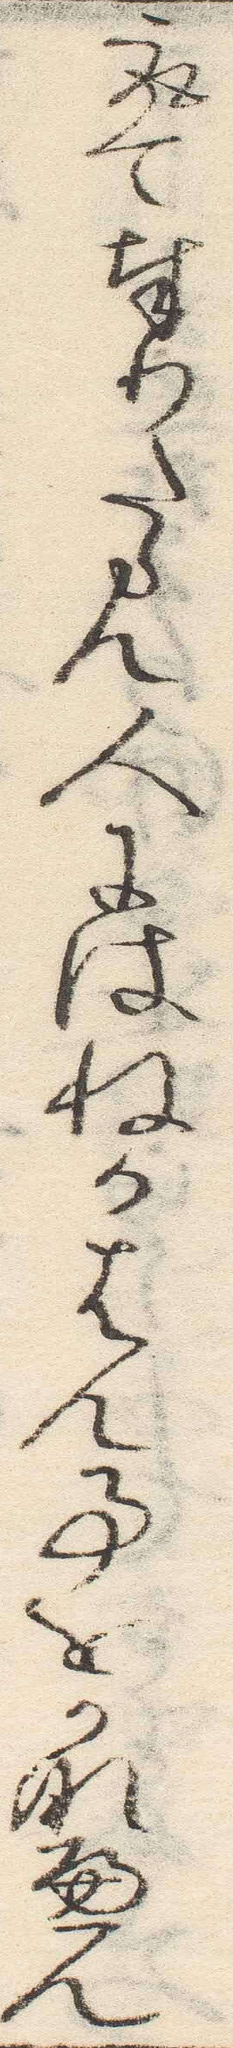取て奉りたらん人にはねかはん事をかなへん
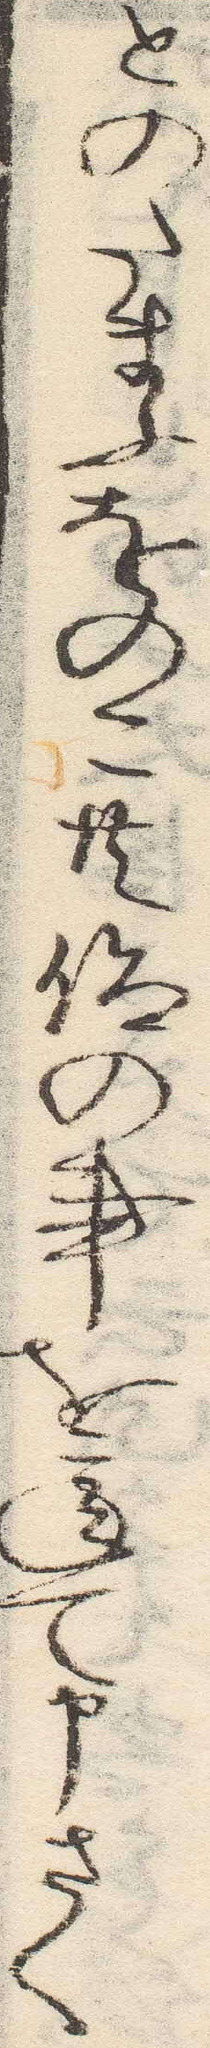とのたまふをのこ共仰の事を承て申さく
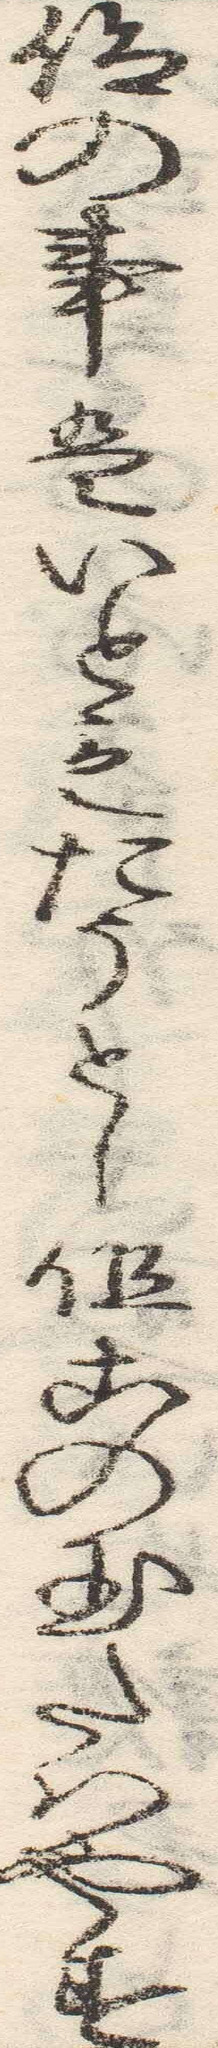仰の事はいともたうとし但この玉たはやす
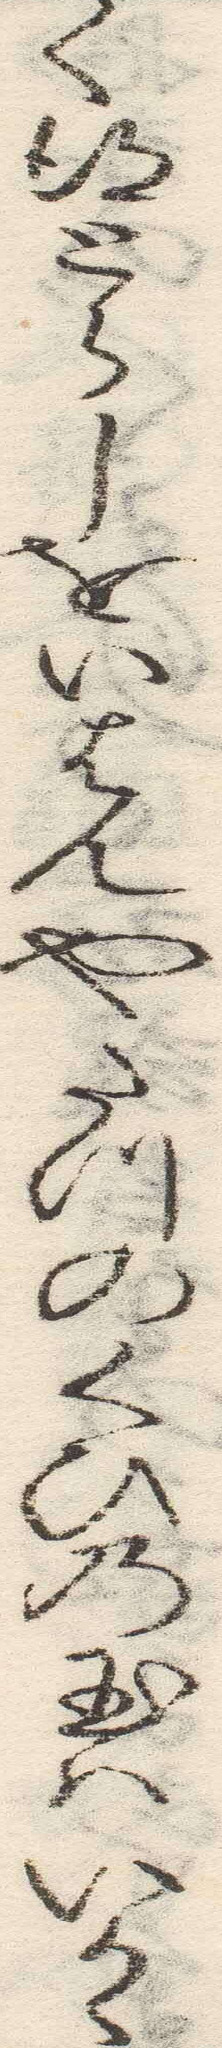く得とらしをいはんやたつのくひの玉はいかゝ
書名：竹取物語
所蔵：東京学芸大学附属図書館 国文学研究資料館
